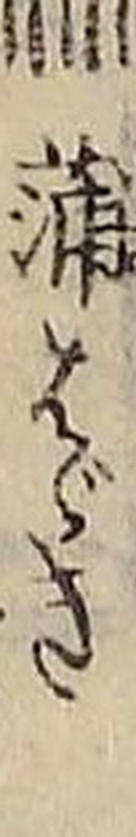蒲はゞき
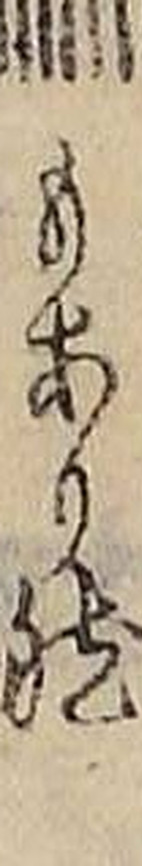もあり然
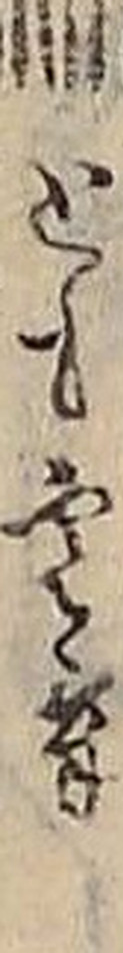とも寒気
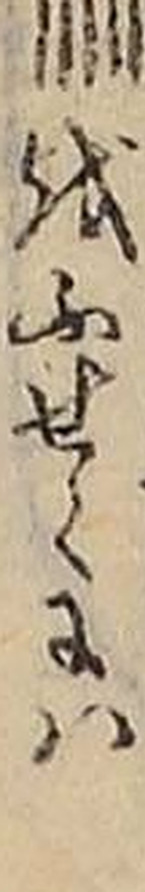をふせくには
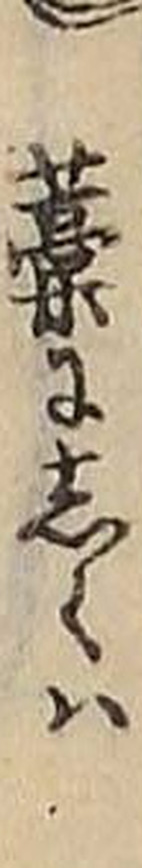藁にしくは
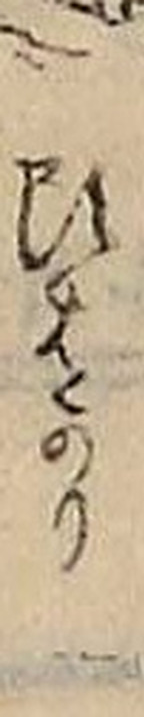頭はかり
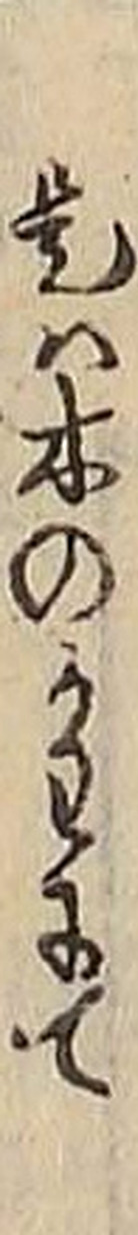是は木のかわにて
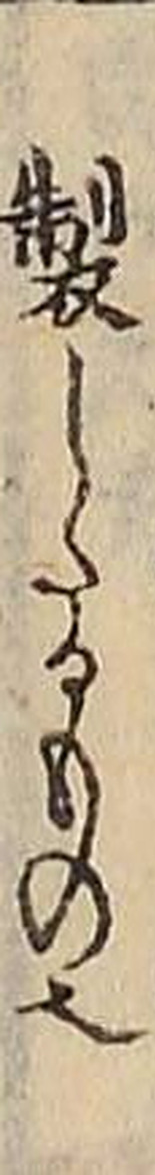製したるもの也
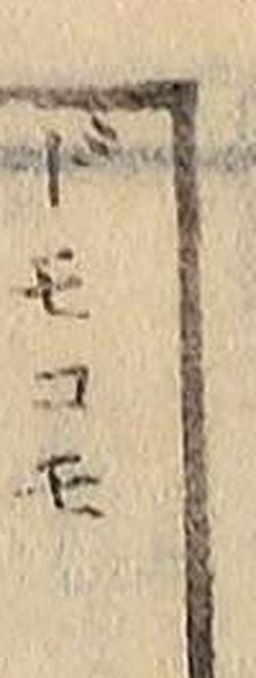ドモコモ
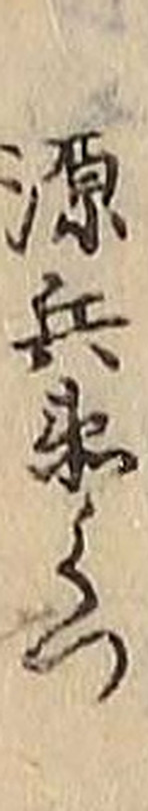源兵衛くつ
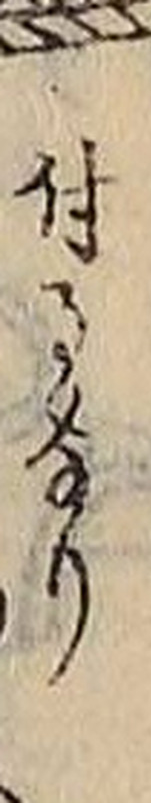付るなり
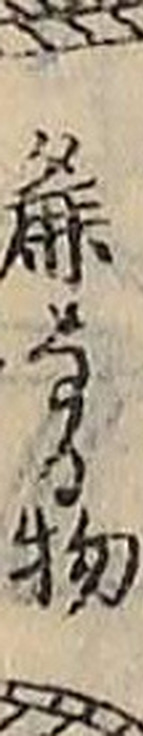麁なる物
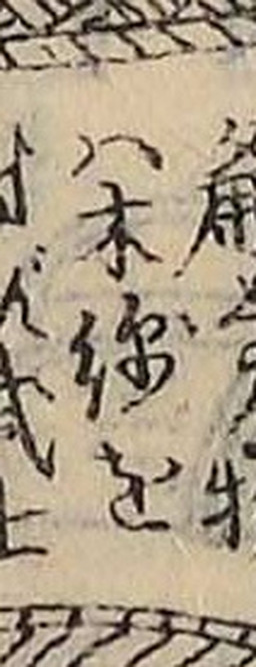は木綿を
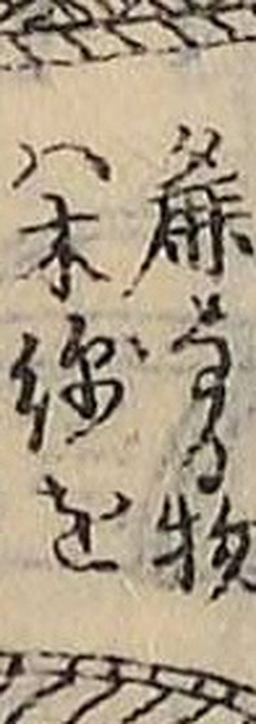は木綿を
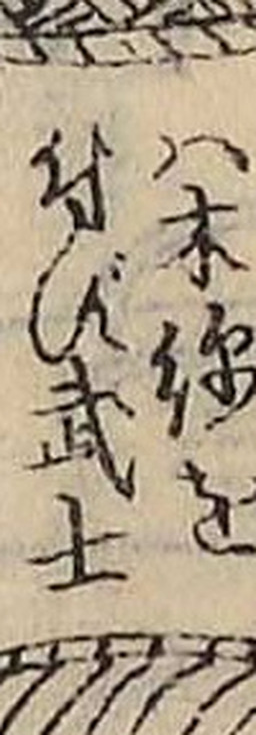付ず武士
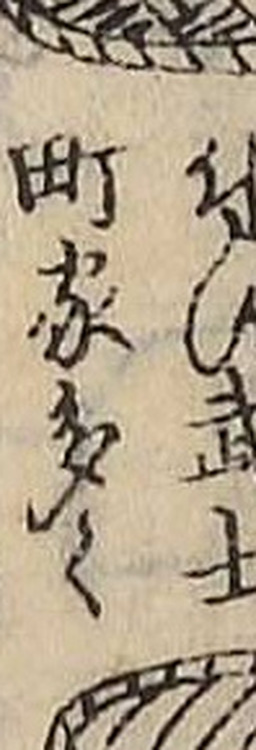町家多く
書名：旅行用心集
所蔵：神戸大学附属図書館 国文学研究資料館
